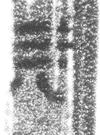而
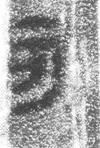可
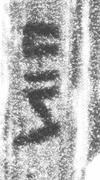胃（謂）
